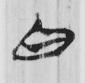白
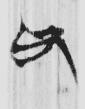父
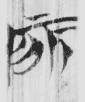所
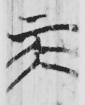天
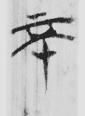不
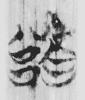豫
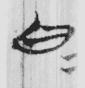白=
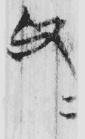父=
